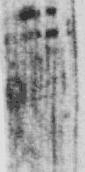聖（聲）
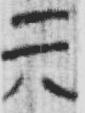亓（其）
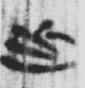出
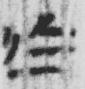於
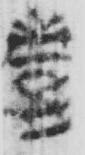情
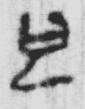也
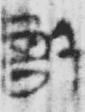○（信）
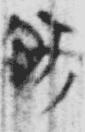肰（然）
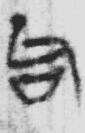句（後）
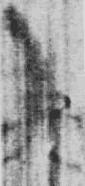亓（其）
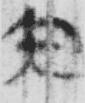內（入）
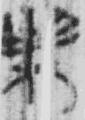拔（撥）
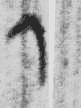人
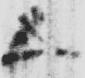之
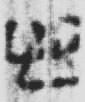心
